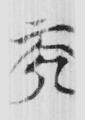而
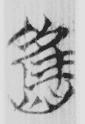舊
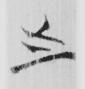之
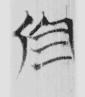於
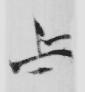上
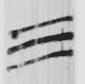三
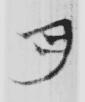月
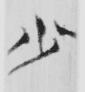少
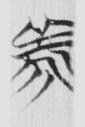羕
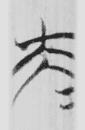夫=
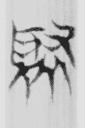聚
